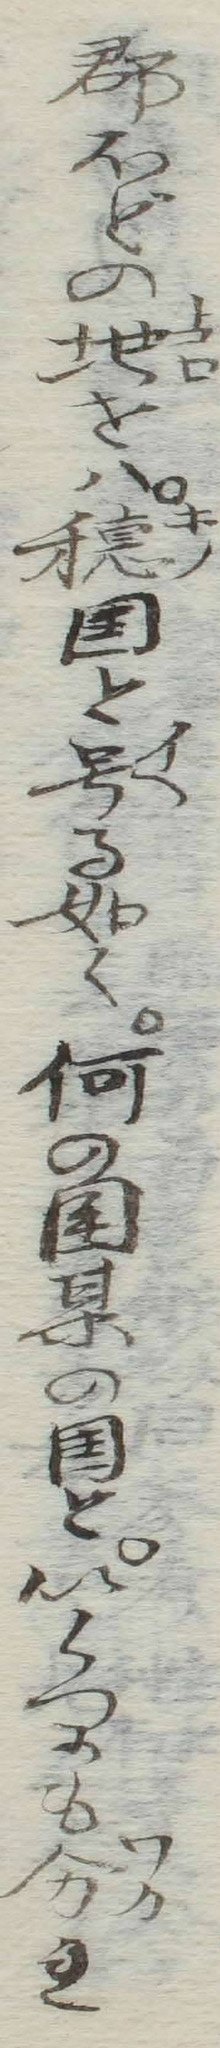郡ほどの地をは。穂国と号る如く。何の国某の国と。いくつにも分れ
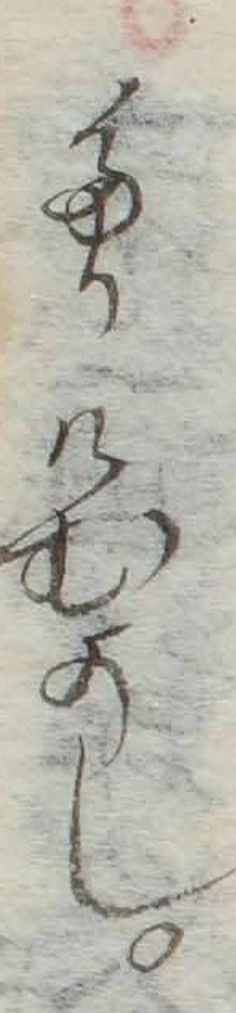たりけむかし。

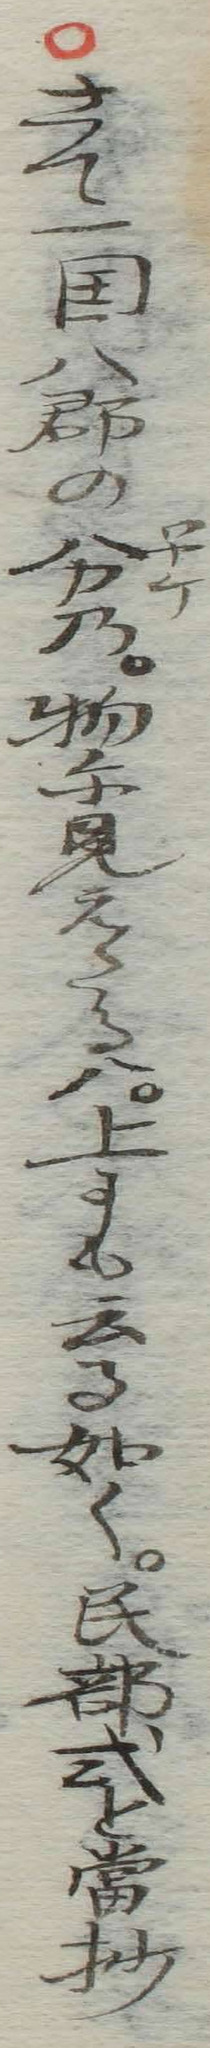〇さて一国八郡の分の。物に見えたるは。上にも云る如く。民部式と当抄
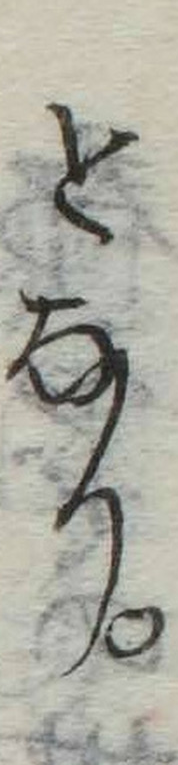となり。
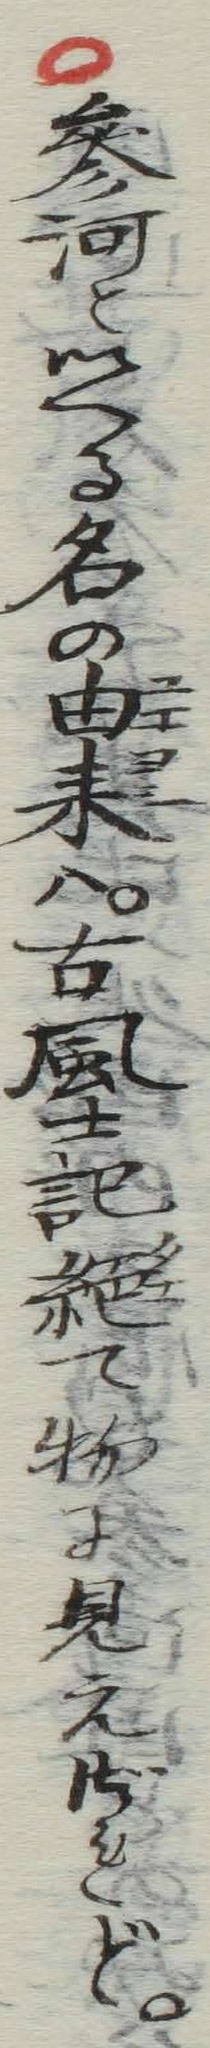〇参河といへる名の由来は。古風土記絶て物に見えざれど。
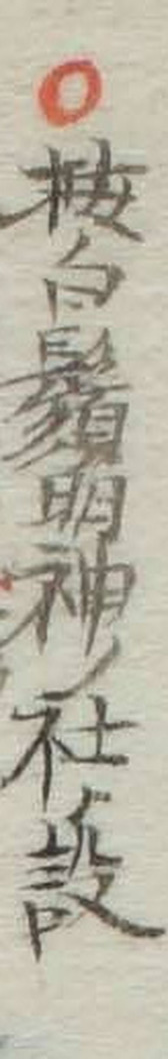〇按白鬚明神ノ社ノ設
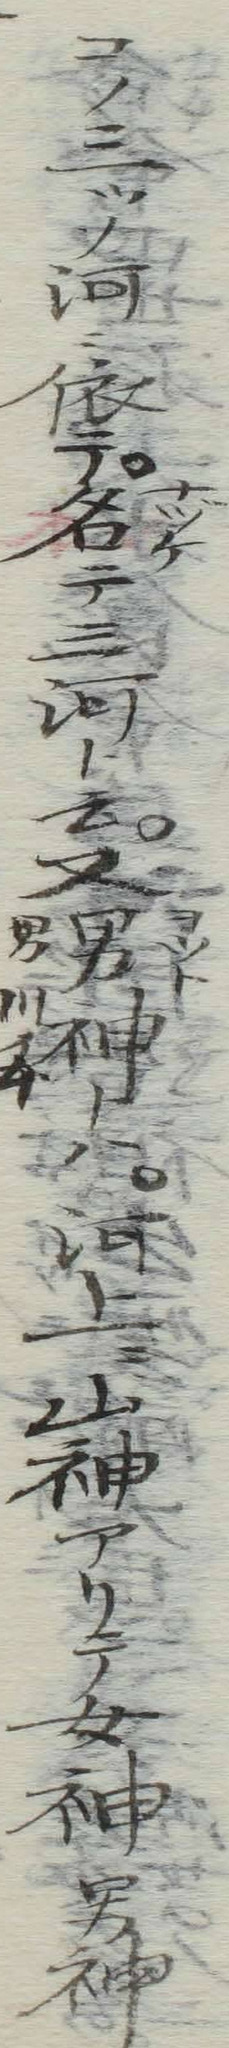コノ三ツノ河ニ依テ。名テ三河ト云。又男神トハ。河上山神アリテ女神男神
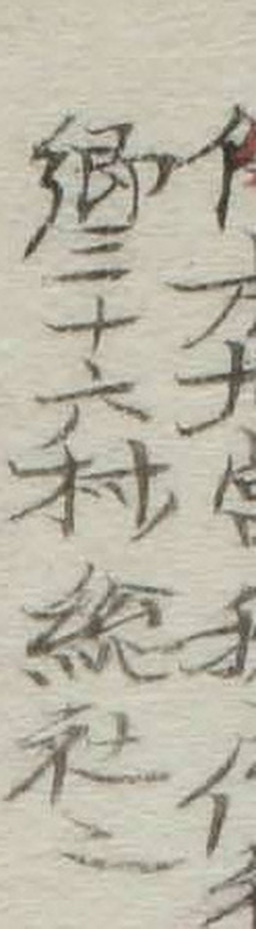郷三十六村総社也
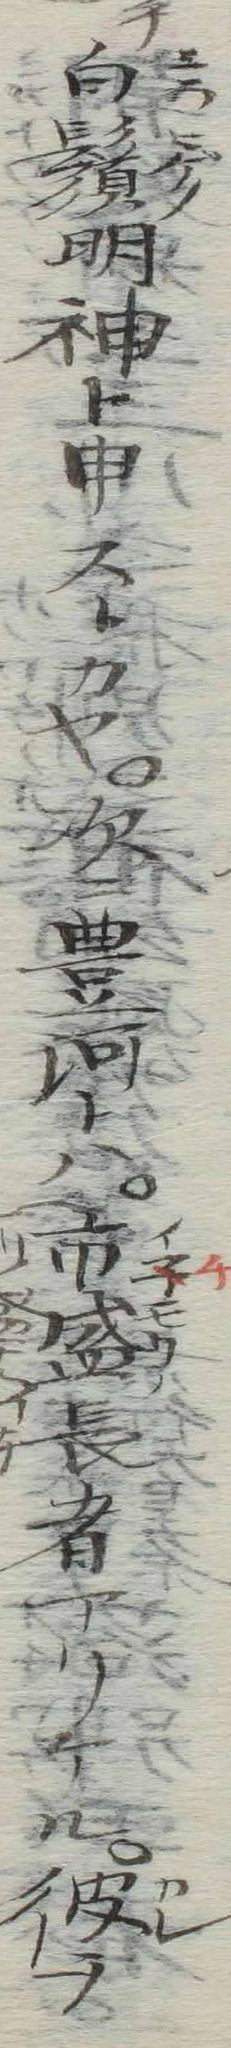白鬚明神ト申ストカヤ。次ニ豊河トハ。市盛長者アリケル。彼ヲ
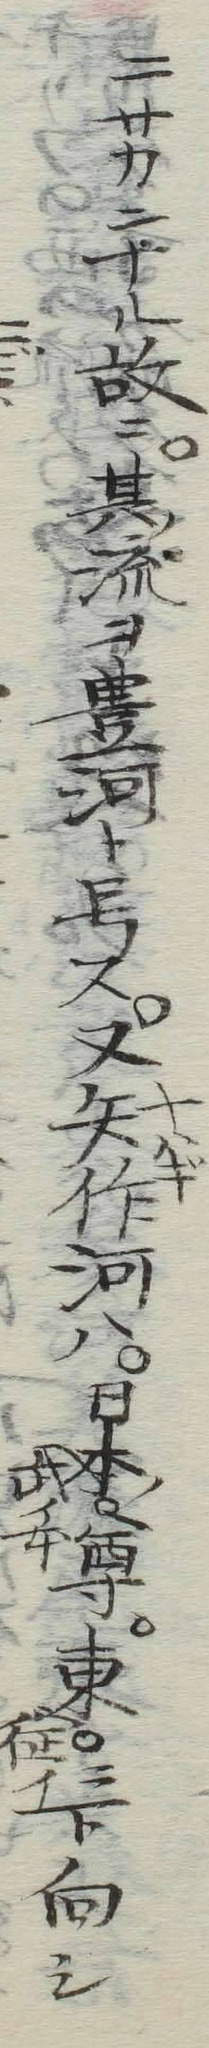ニサカンナル故ニ。其流を豊河ト号ス。又矢作河ハ。日本尊。東〇下向シ
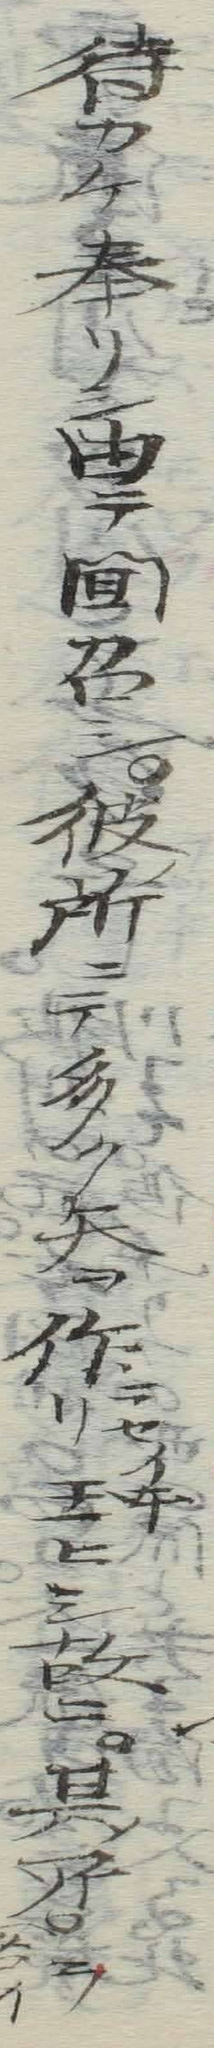待カケ奉リシ由ニ聞召シ。彼所ニテ多ク矢ヲ作リ玉ヒシ故ニ。其所〇ヲ

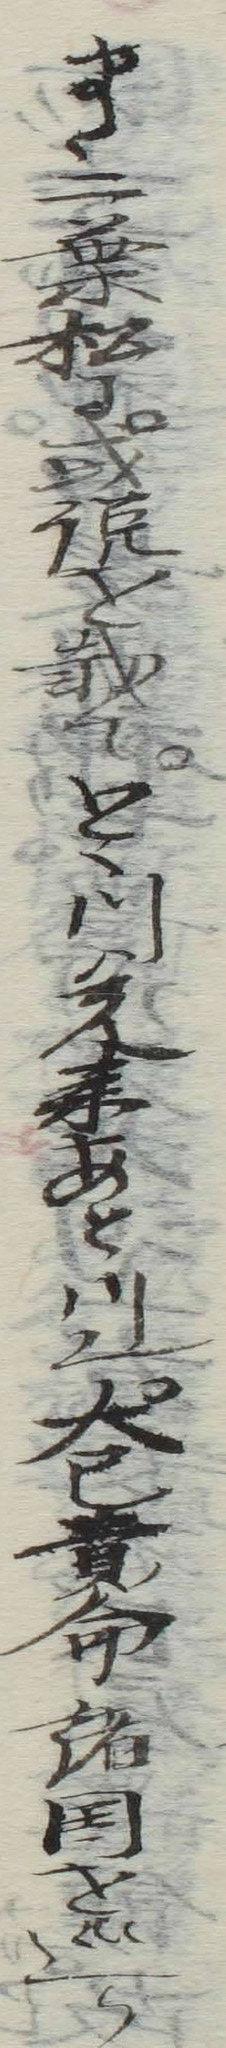また二葉松に。或説を載て。とゝ川は元来あと川也。大己貴命諸国を巡り
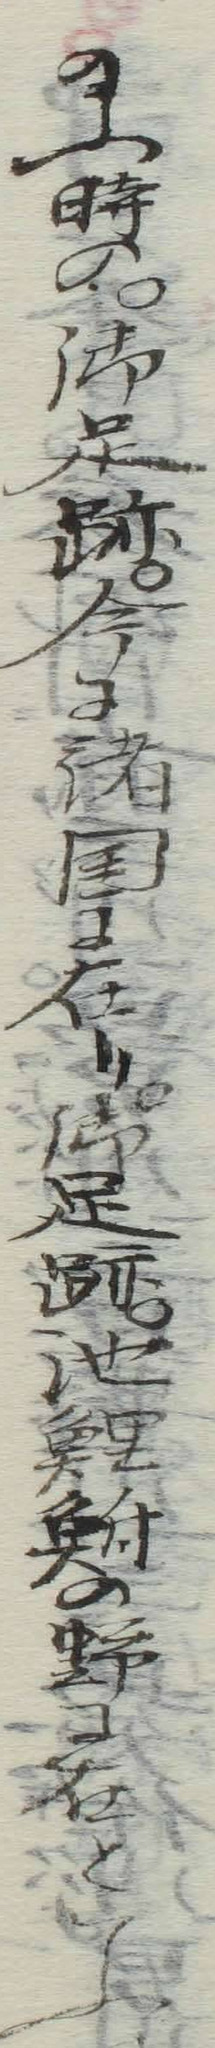給ふ時の。御足跡。今に諸国に在り。御足跡。池鯉鮒の野に在といふ。
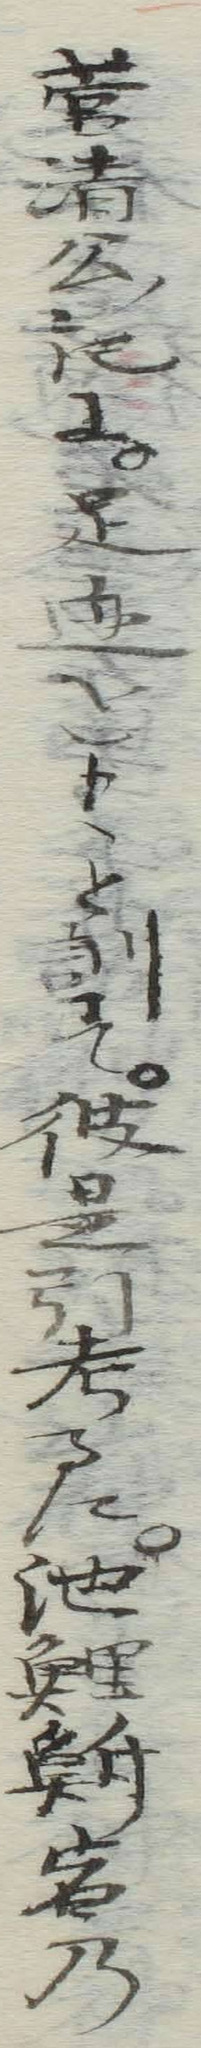菅清公記に。足迹をトヽと訓にて。彼是引考るに。池鯉鮒宿の
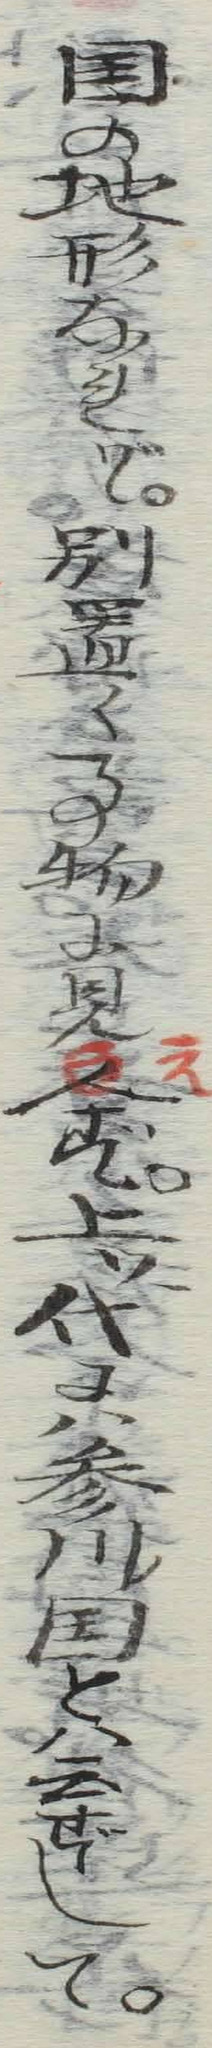国の地形なれど。別置く事物に見えず。上代には参川国とは云ずして。
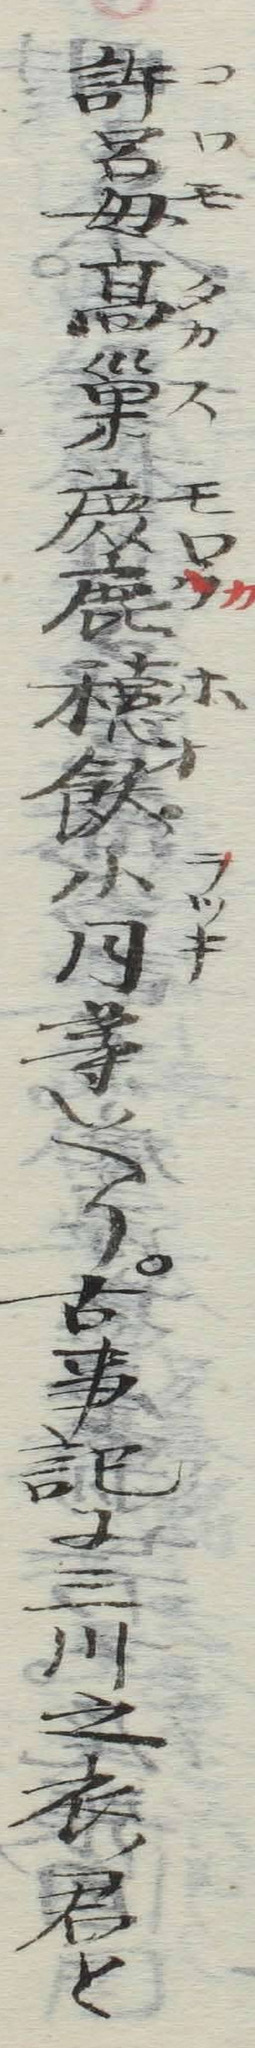許呂母高巣庶鹿穂飫。小月等いへり。古事記に三川之衣君と
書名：三河国古跡考
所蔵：国文学研究資料館
